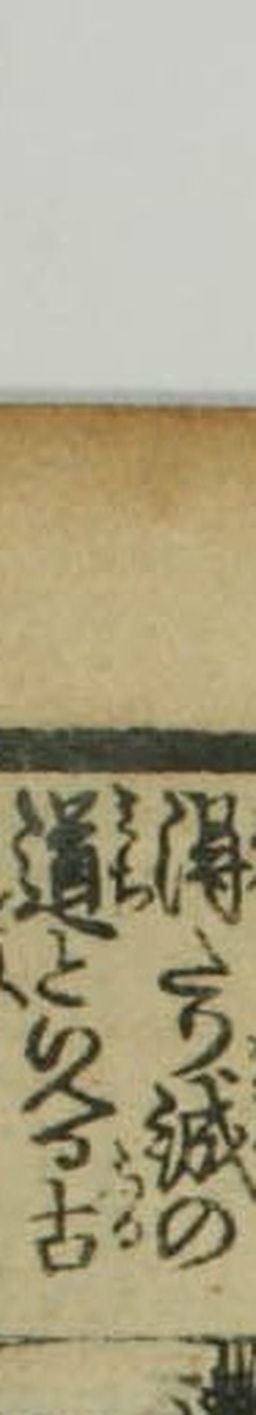道といへる古
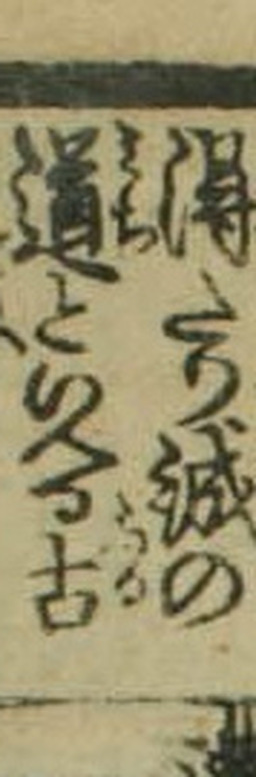道といへる古
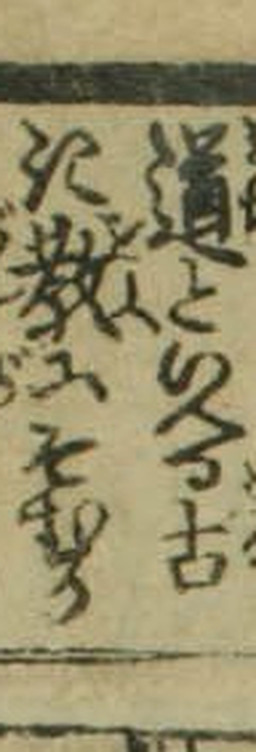き教にそむか
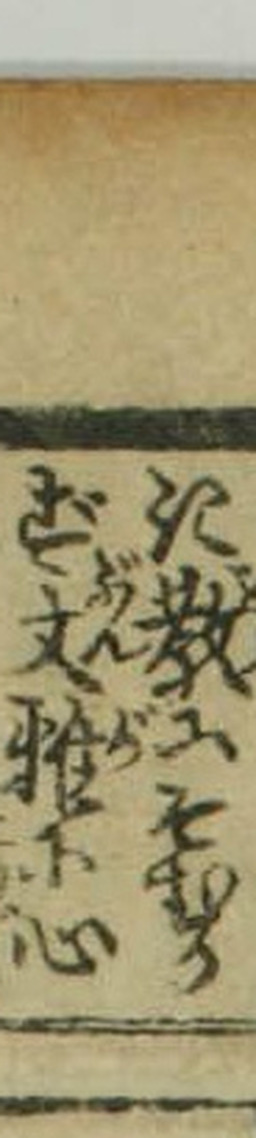ず文雅に心
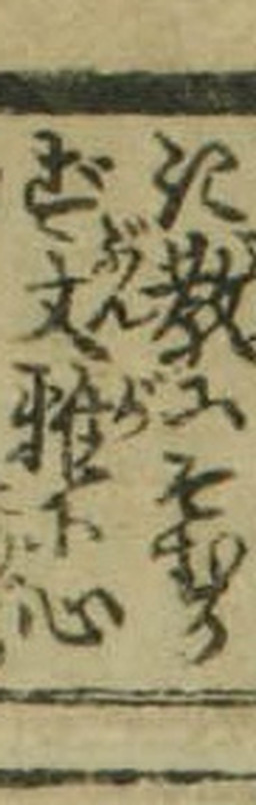ず文雅に心
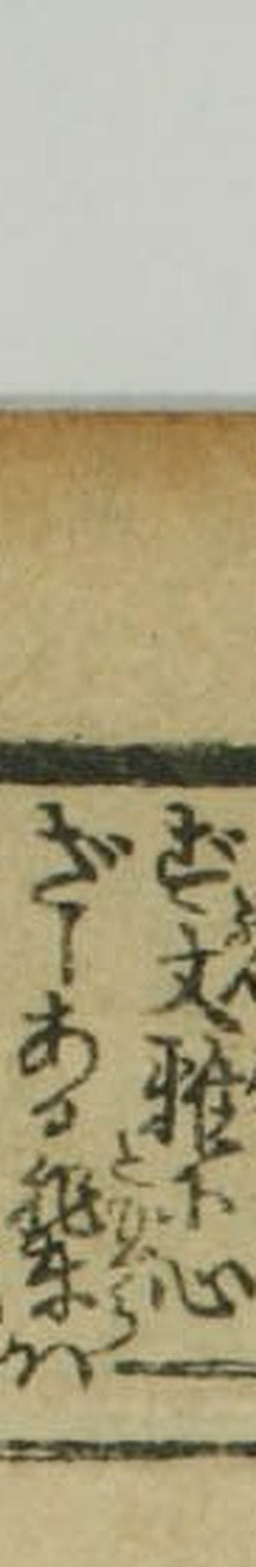ざしある輩は
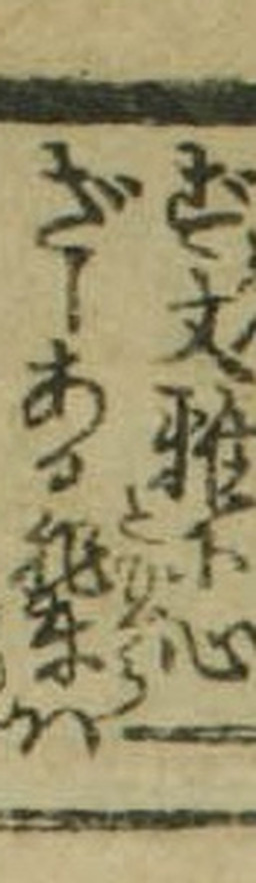ざしある輩は
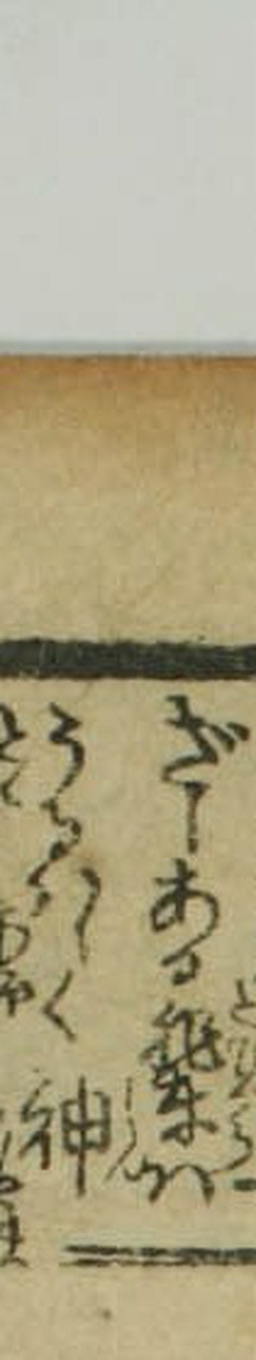うるはしく神
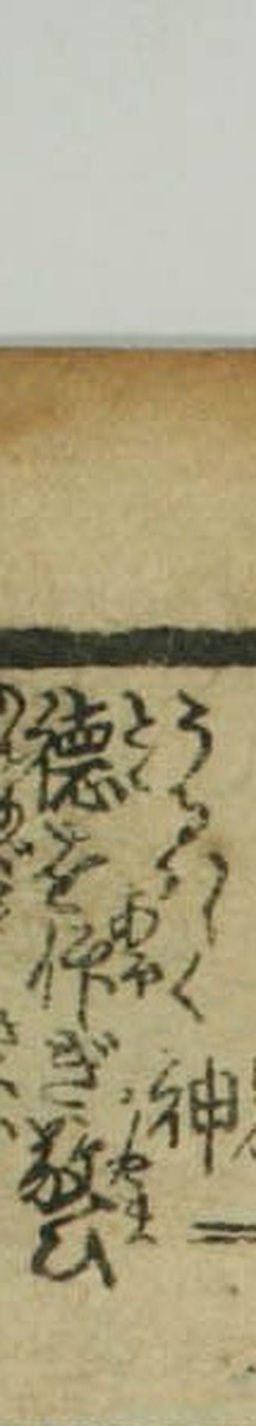徳を仰ぎ敬ひ
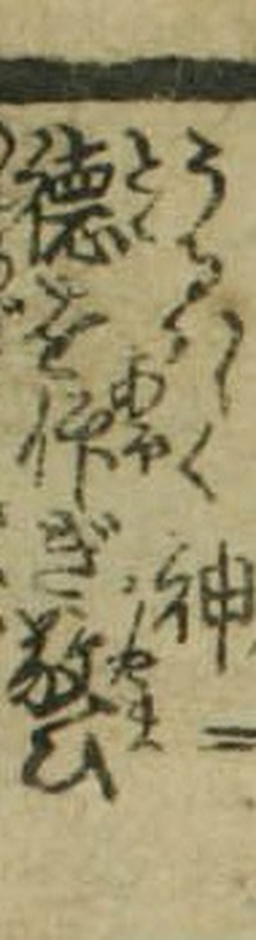徳を仰ぎ敬ひ
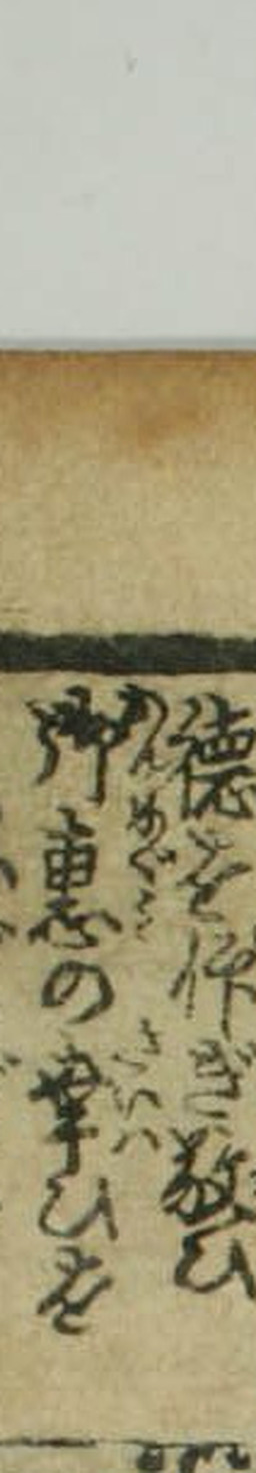御恵の幸ひを
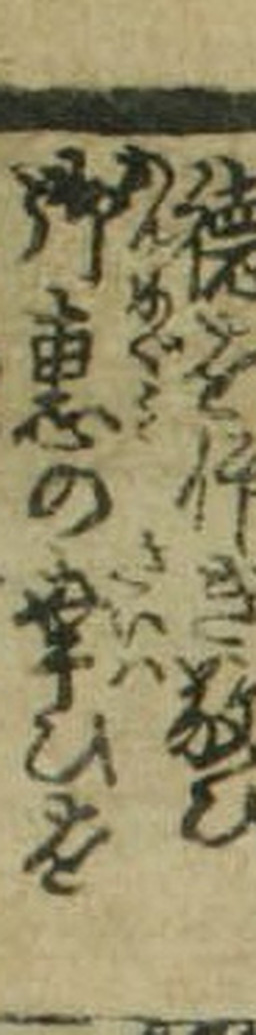御恵の幸ひを
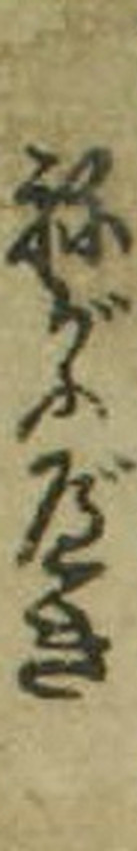ねがふべき
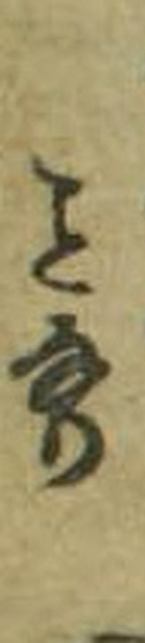ことなり

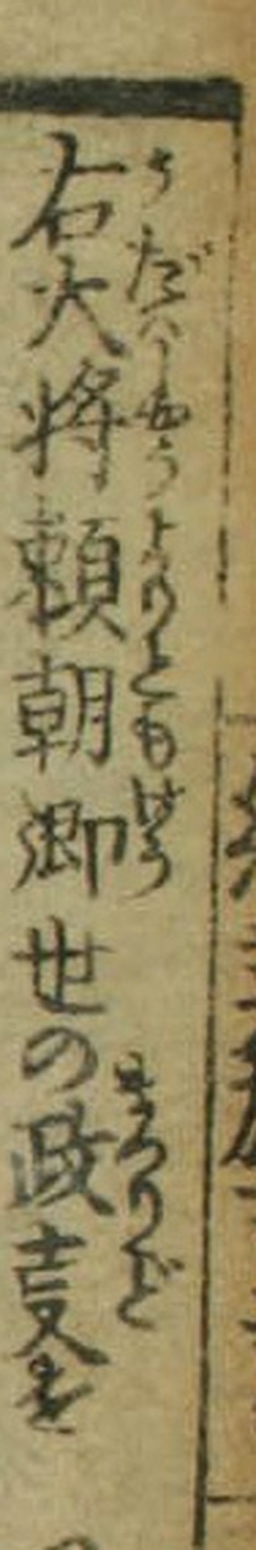右大将頼朝卿世の政事を
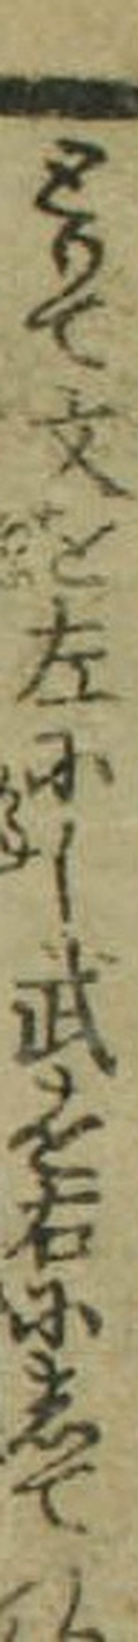とりて文を左にし武を右にして
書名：續英雄百人一首
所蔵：東京学芸大学附属図書館
